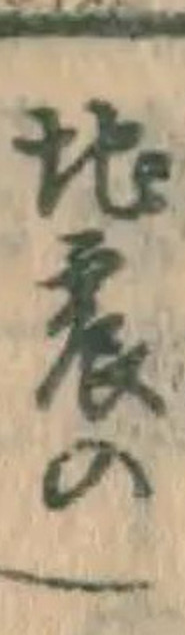地震の
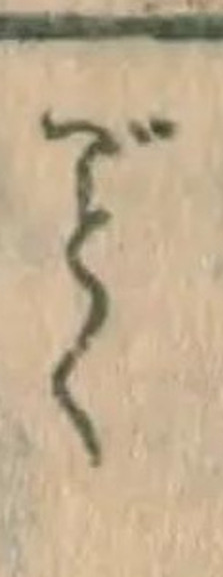ごとく
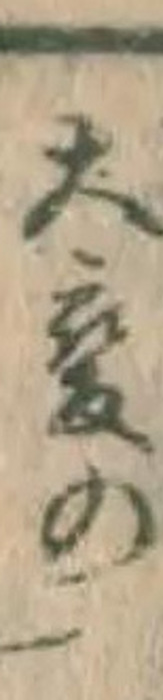大変の
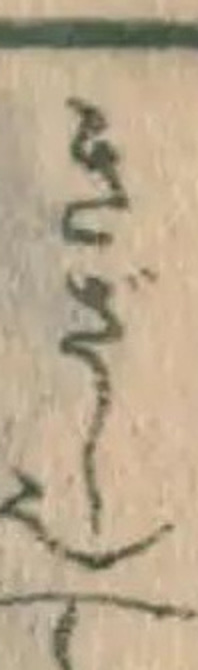きざし也
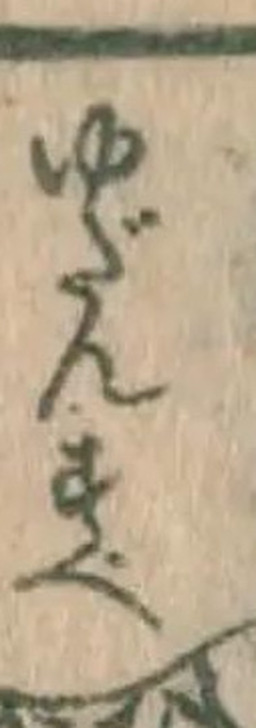ゆだんすべ
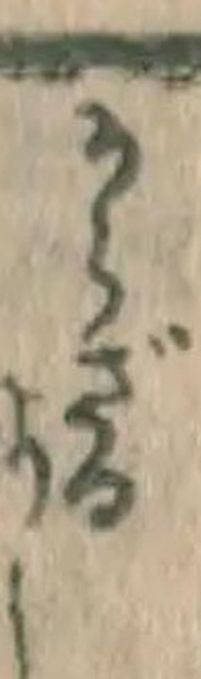からざる
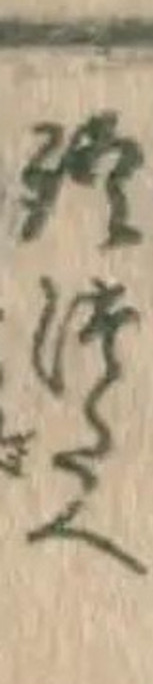語つたへ
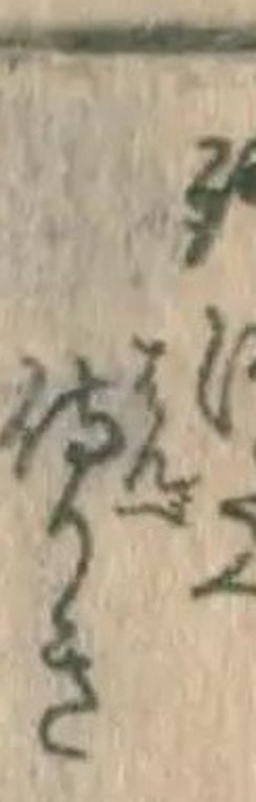侍りき
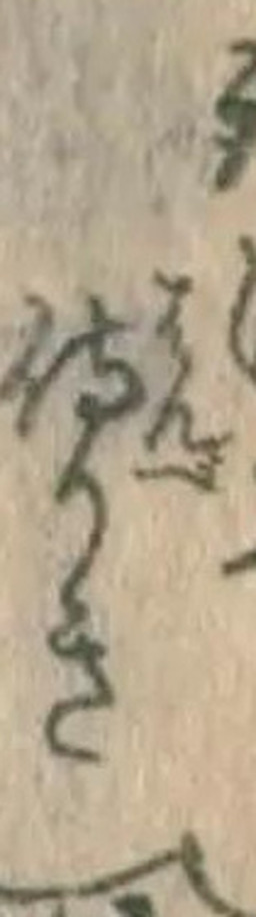侍りき
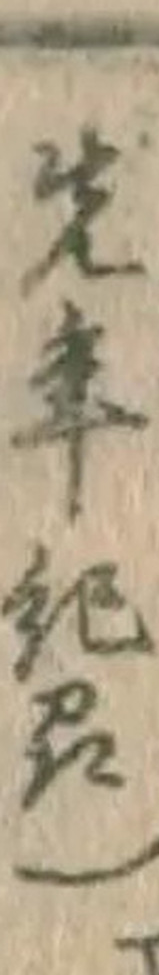先年紀州
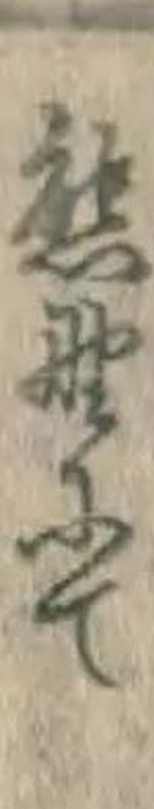熊野にて
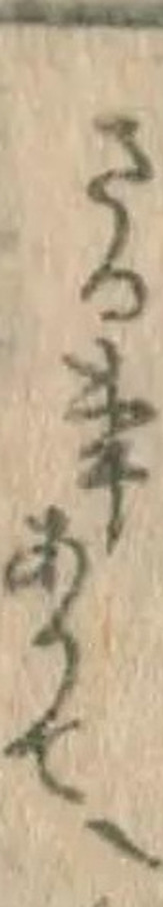さる事ありて
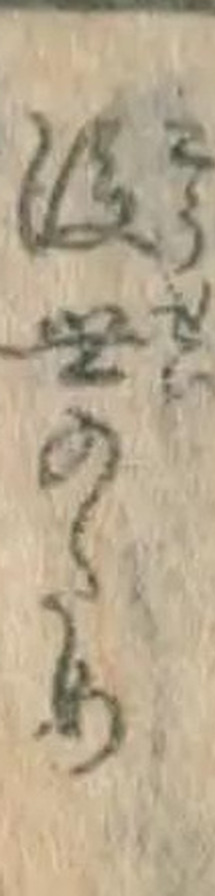後世のため
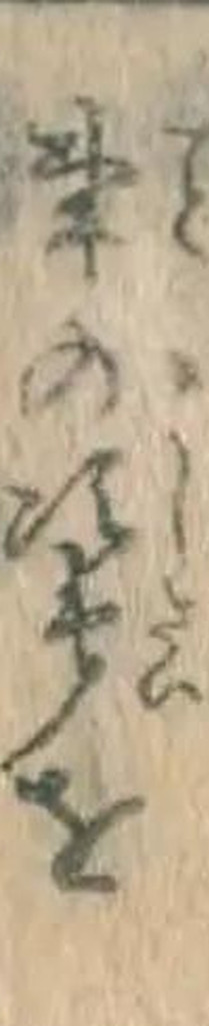事の次第を
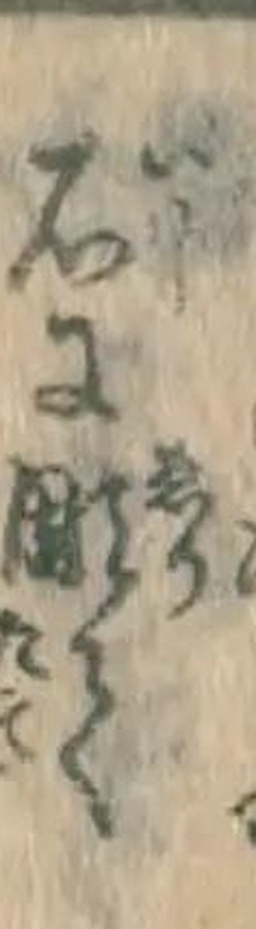石に彫て

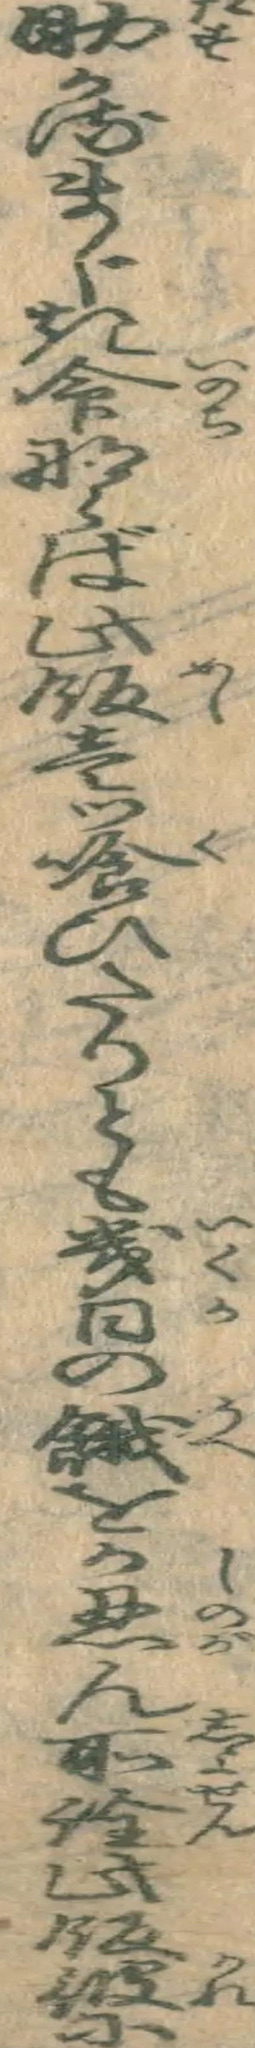助かるまじき命ならば此飯壱ツ喰ひたりとも幾日の餓をか忍ん所詮此飯彼に
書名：養蚕秘録 3巻. [3]
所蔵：国立国会図書館 National Diet Library, JAPAN
